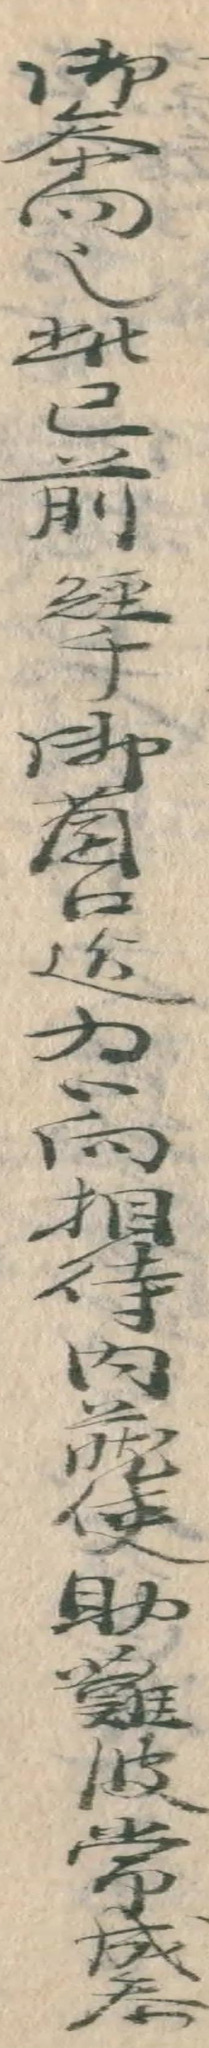御参向也此已前経千御薗口迄為御向相待内蔵使助難波常成参
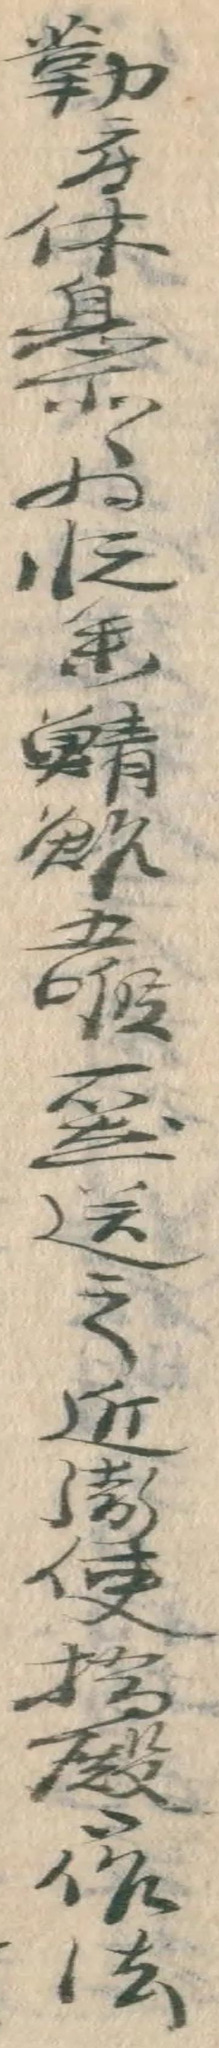勤ニ付休息所へ為祝参鯖鮓五喉盃送也近衛使橋殿御作法
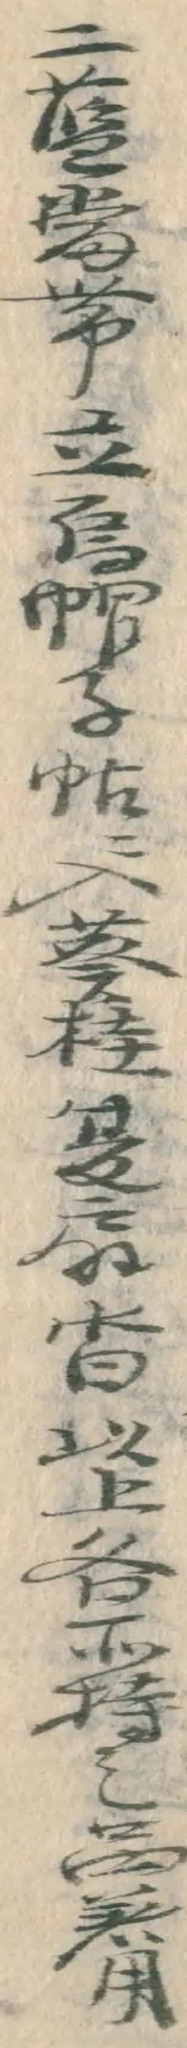二藍當帯立烏帽子帖ニ入葵桂夏扇沓以上各所持之品着用

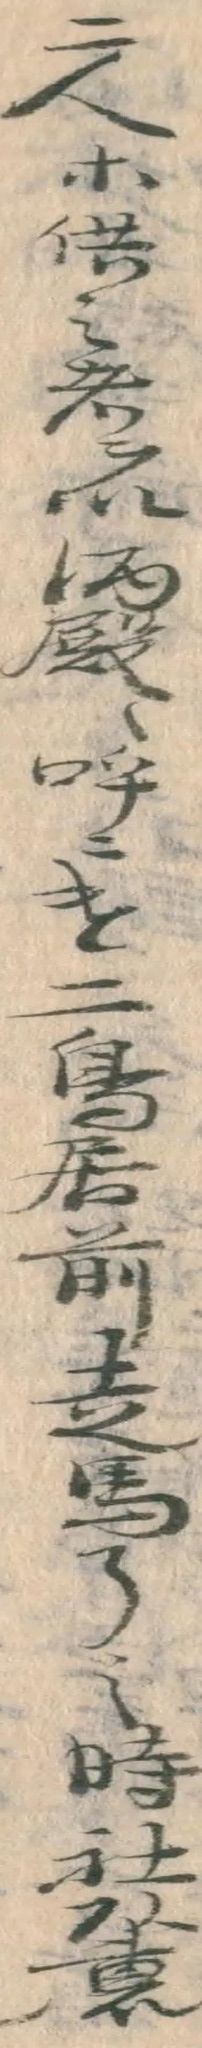二人等供之者ヲ以酒殿へ呼ニ遣二鳥居前走馬了之時社頭裏
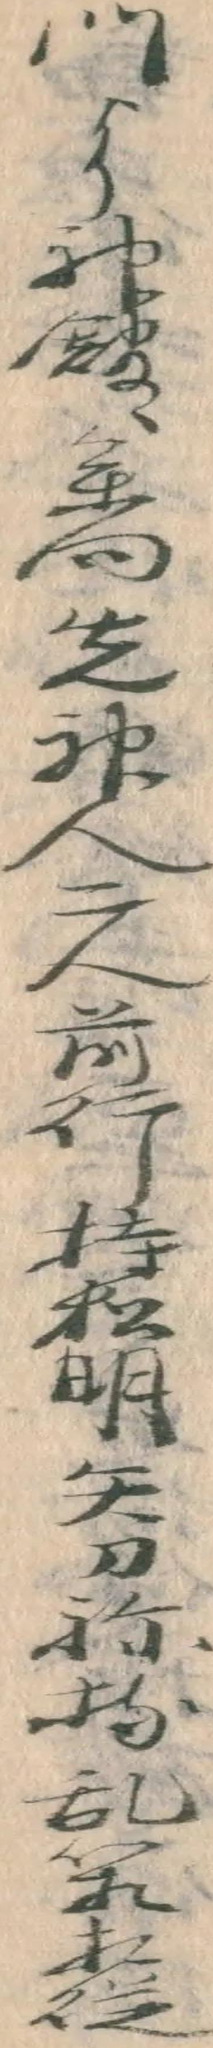門より神館へ参向先神人二人前行持松明矢刀祢持乱箱相従
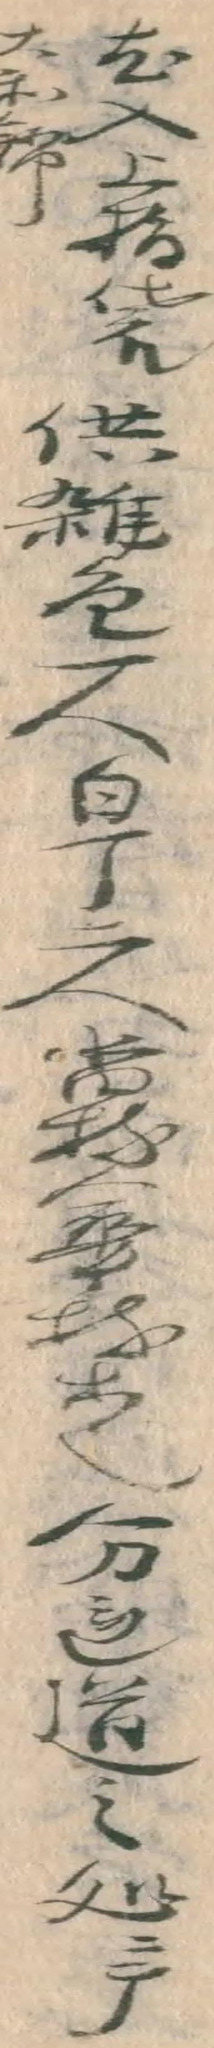尤入上指袋共大和錦供雑色一人白丁二人沓持傘持等也分れ道之処ニテ
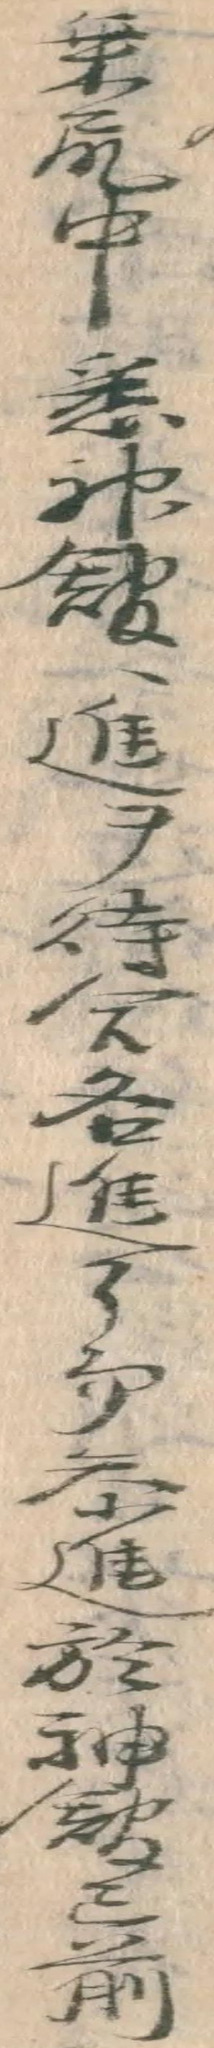乗尻中悉神舘へ進ヲ待合各進了而参進於神舘已前
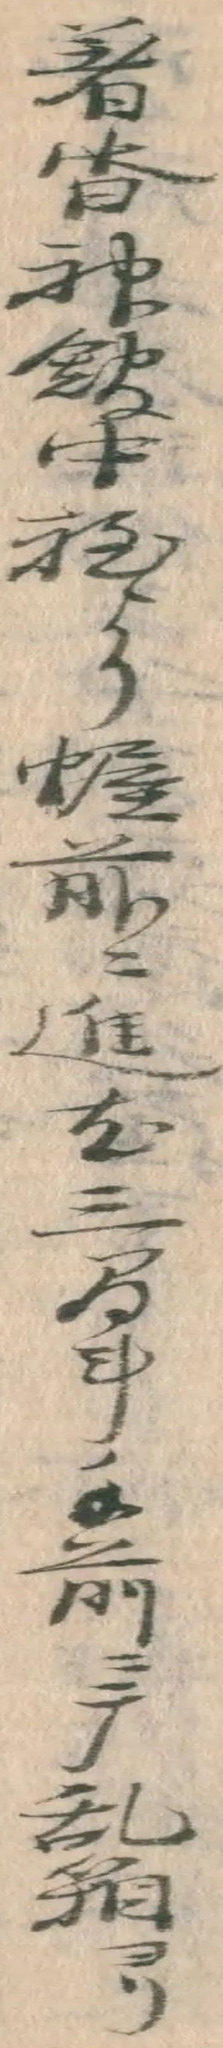着沓神舘中程より幄前ニ進尤三間斗手前ニテ乱箱ヨリ
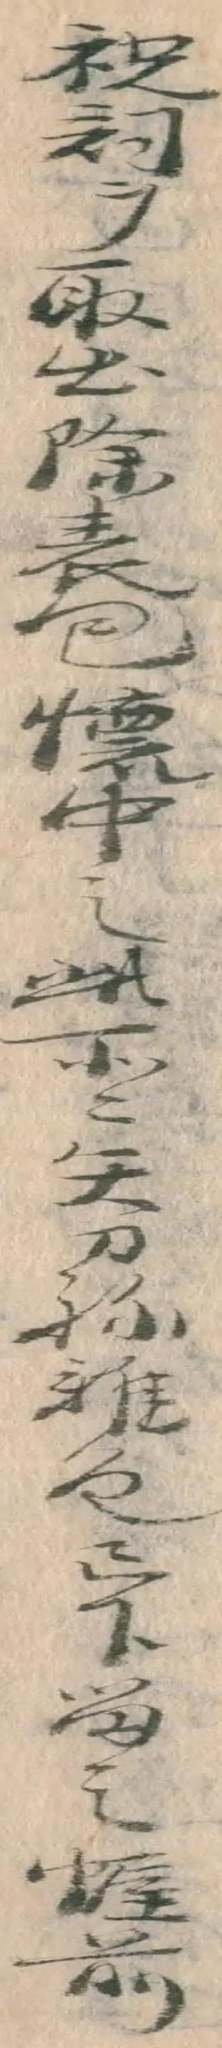祝詞ヲ取出除表包懐中之此所ニ矢刀祢雑色已下留之幄前
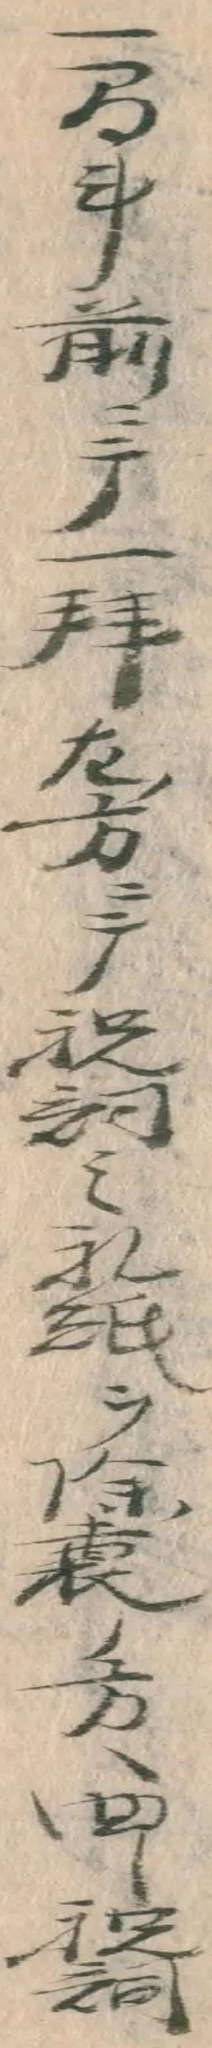一間斗前ニテ一拝左ノ方ニテ祝詞之礼紙を除裏の方へ回し祝詞
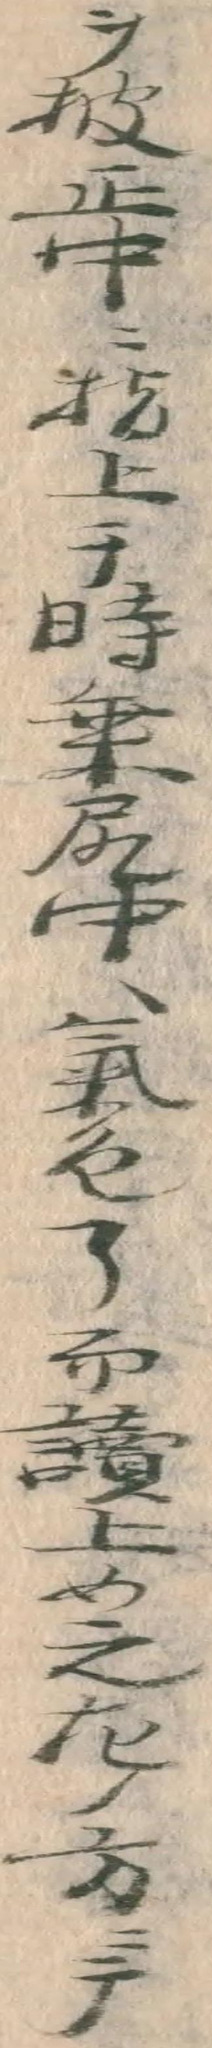ヲ被正中に指上于時乗尻中へ氣色了而讀上如之左ノ方ニテ
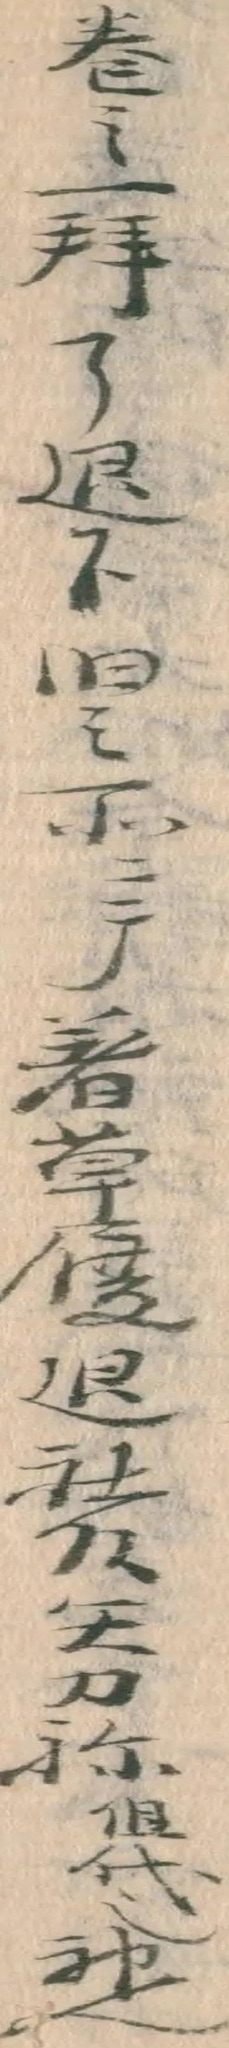巻之一拝了退下旧之所ニテ着草履退社頭矢刀祢伹代也神人
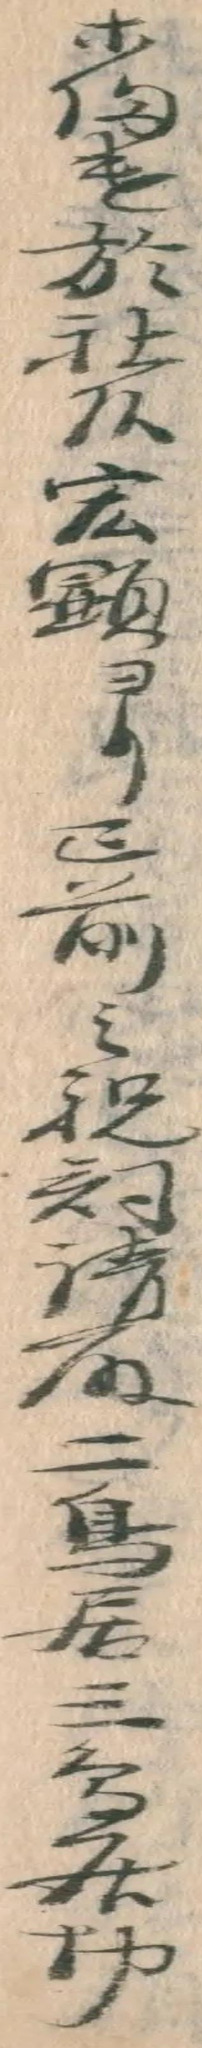等備遣於社頭宏顕より已前之祝詞請取二鳥居三鳥居切
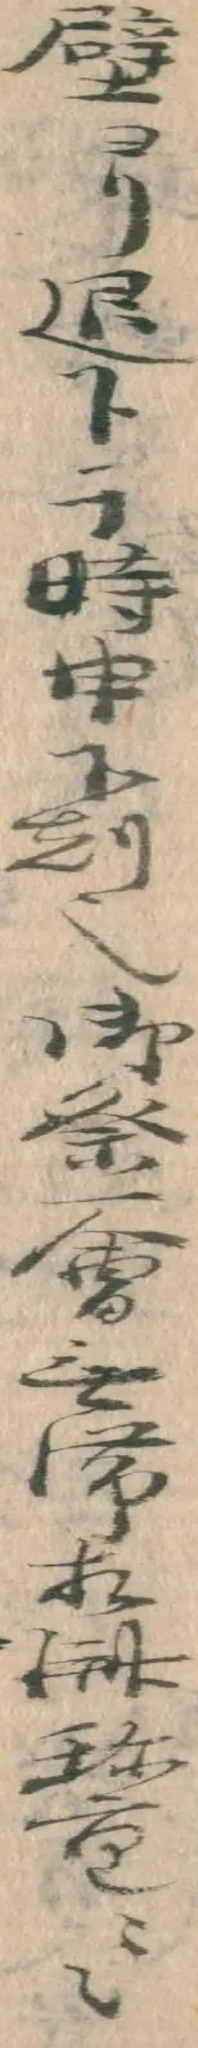壁ヨリ退下于時申下刻也御祭一會無滞相済珍重々々
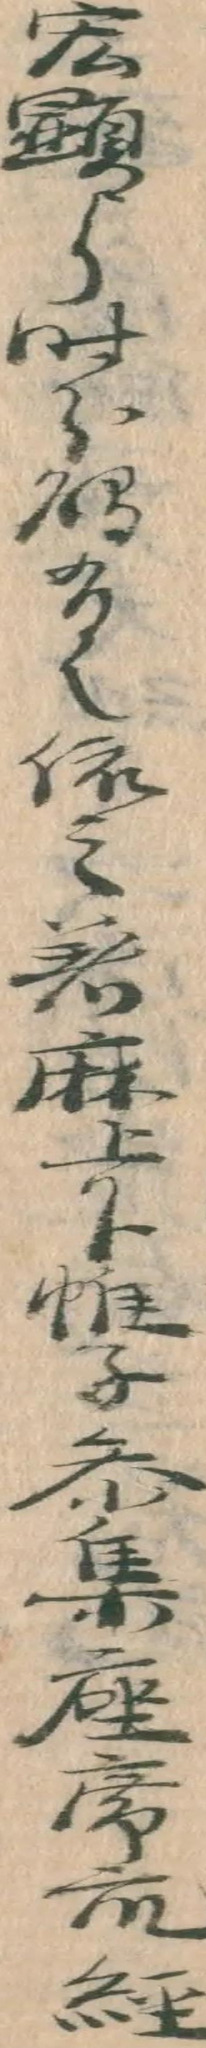宏顕より時分触有之依之着麻上下帷子参集座席衆経
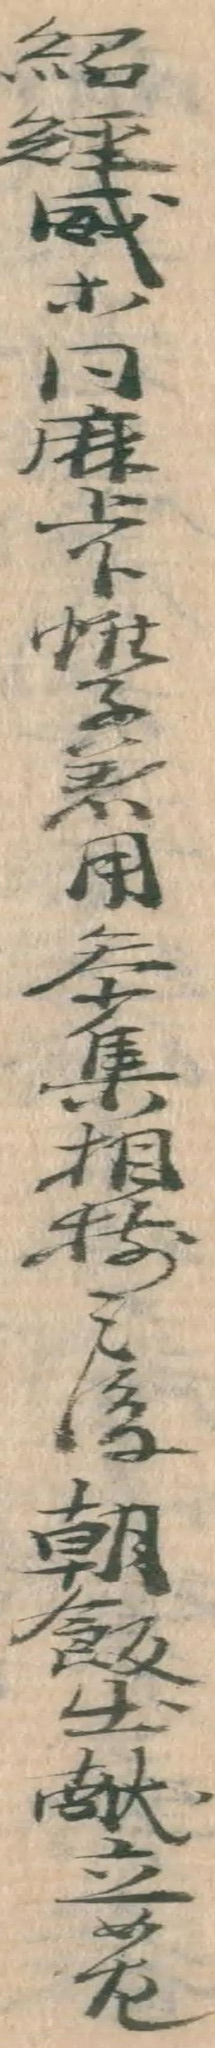紹経威等同麻上下帷子着用参集相揃之後朝飯出献立如左
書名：賀茂社記録. 第65冊
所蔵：国立国会図書館 National Diet Library, JAPAN
